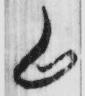㠯
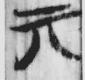亓
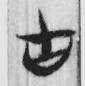古
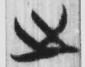之
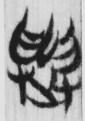○（舉）
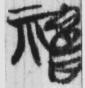禱
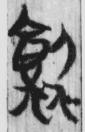○（蝕）
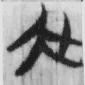太
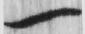一
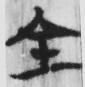全
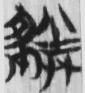豢
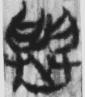○（舉）
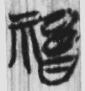禱
